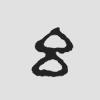玄
